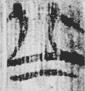丘
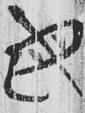母
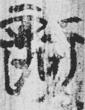訶（歌）
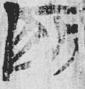所
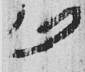㠯（以）
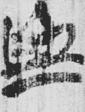爲
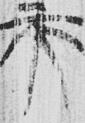天
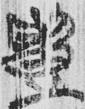豊（禮）
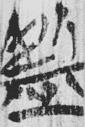監
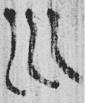川
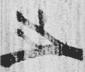之
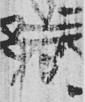都
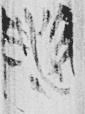澗
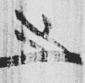之
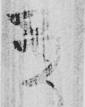邑
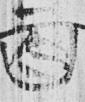百
